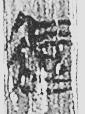{辶石}
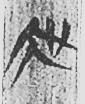吳
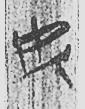𡚦
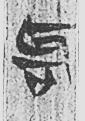{㠯ㅋ}
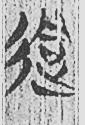迵
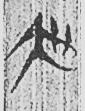吳
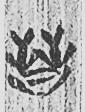晉
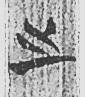之
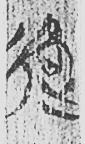{辶各}
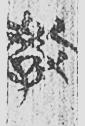教
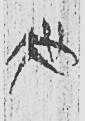吳
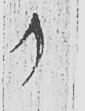人
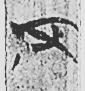反
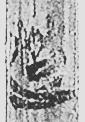楚
